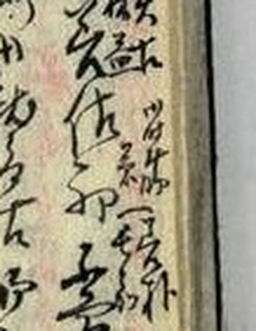廿九日
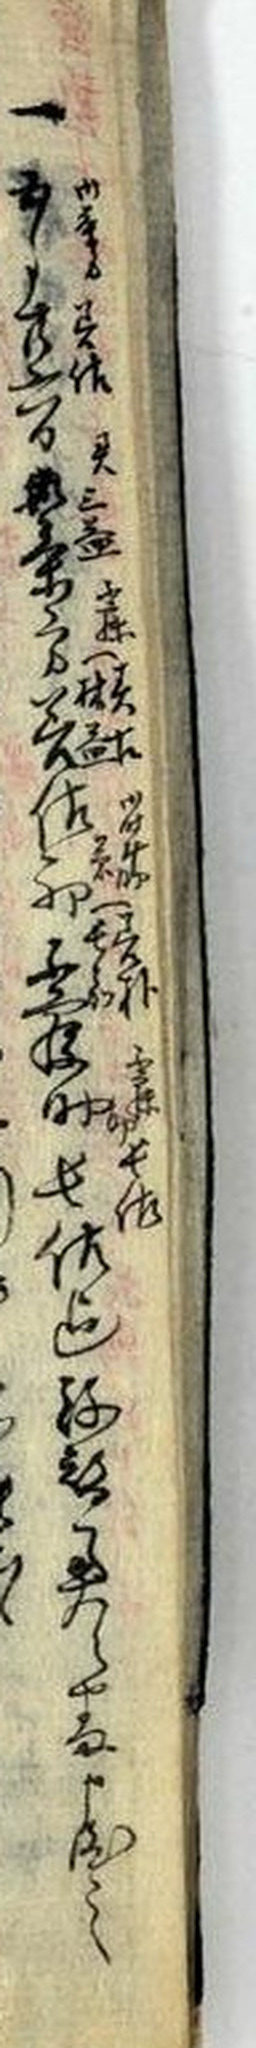一五月廿六日御茶方善佐初不寝助長佐迄役替奥之番申渡之
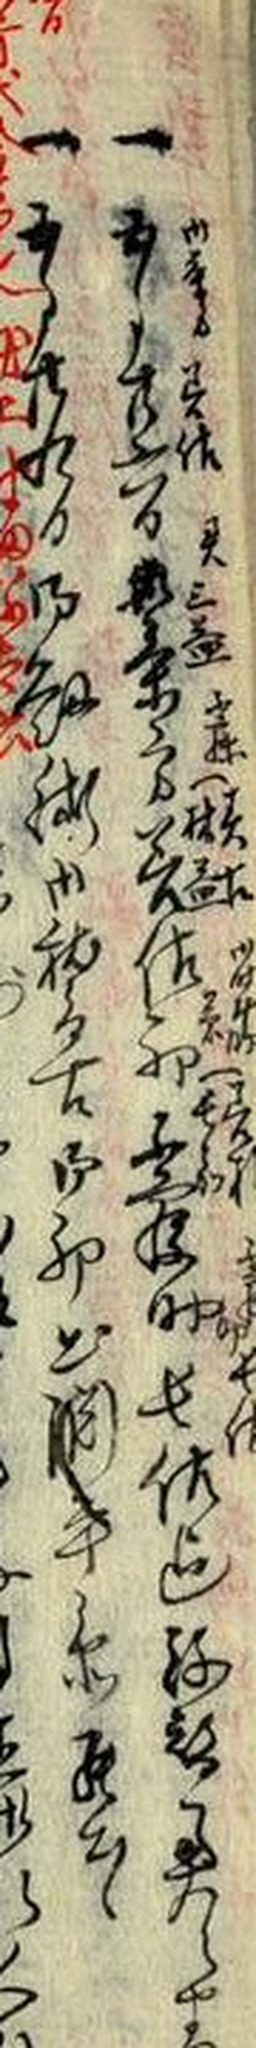一五月廿九日御釼術御稽古御初馬出淵平兵衛罷出候
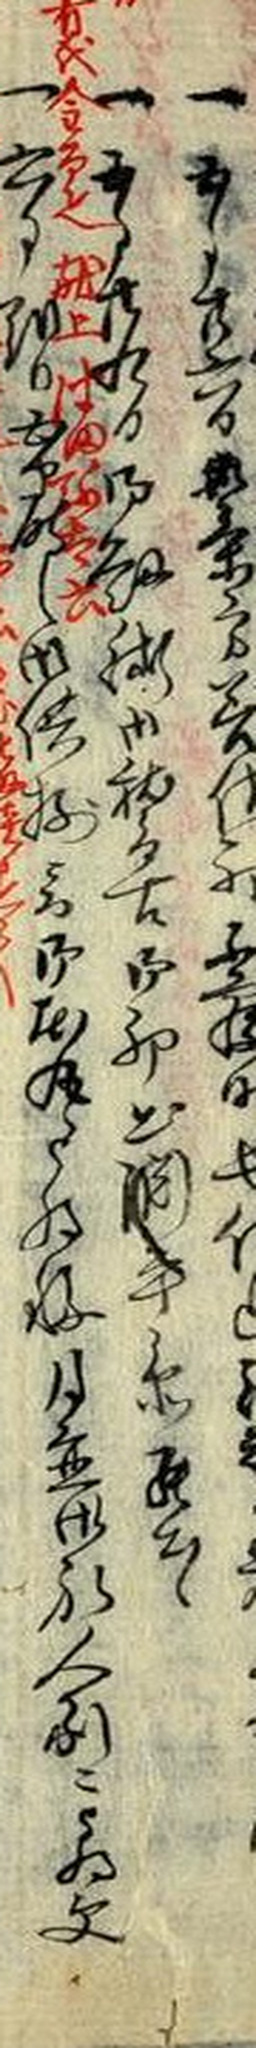一六月朔日五半時之御供揃ニ而御本丸被為移月並御礼人別ニ被為受
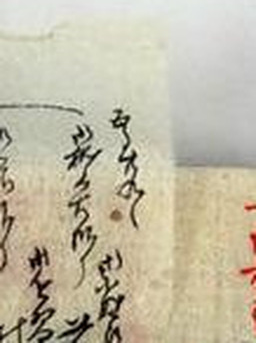五月廿九日
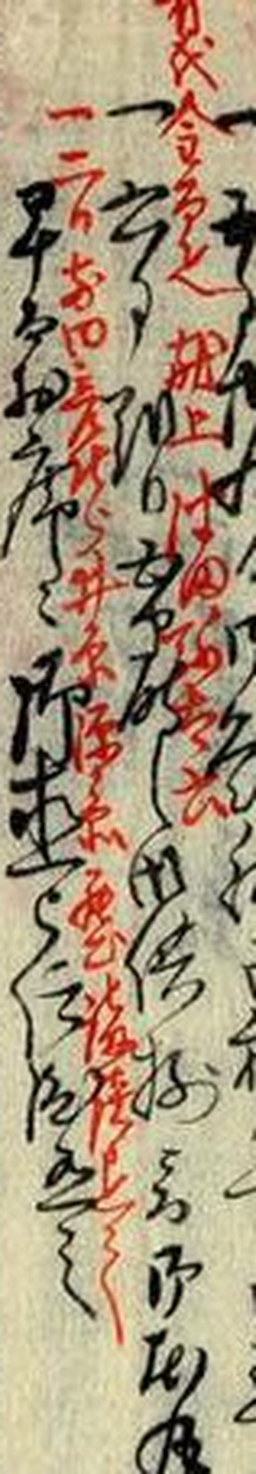畢而於席々御直被仰渡有之
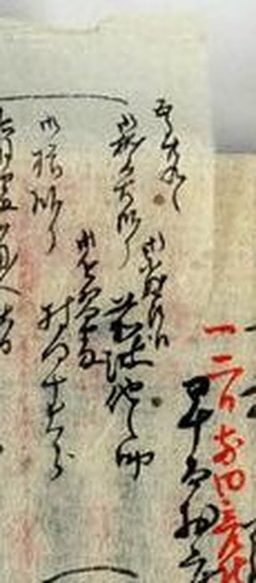御稽古掛り前波他之助
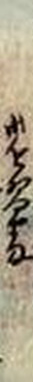御近習番
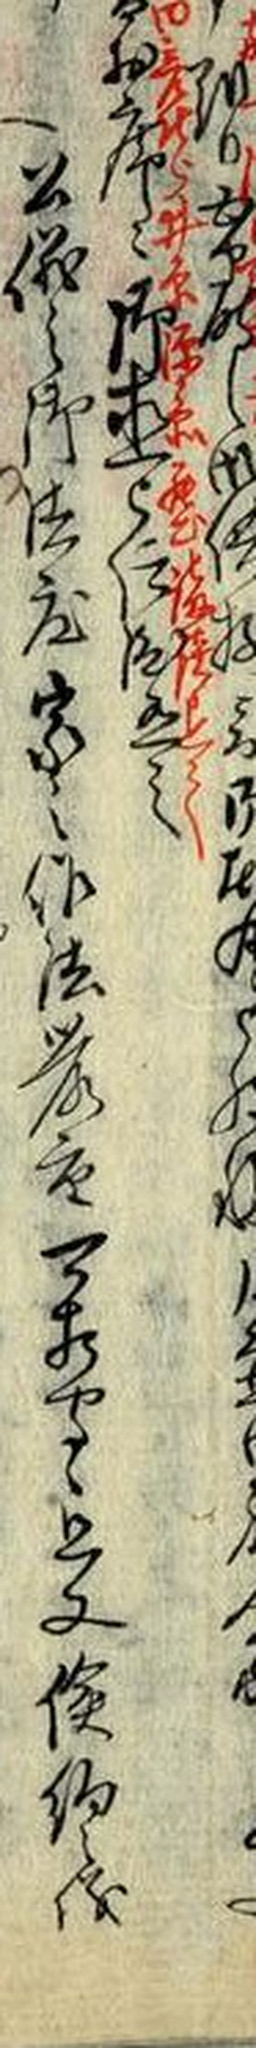公儀之御法度家之作法厳重可相守候且又倹約之儀
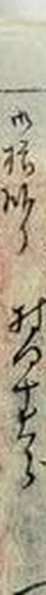御櫛掛り村田十太郎
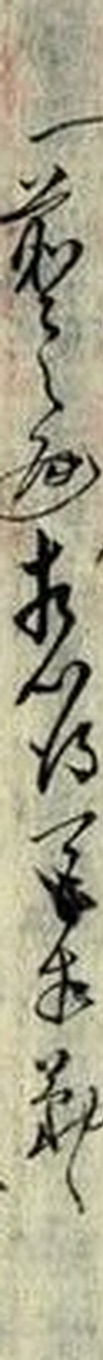前々之通相心得可相勤候
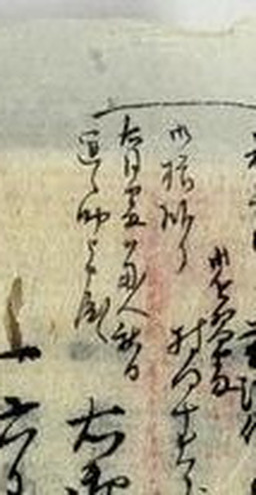右月番御用人秋田
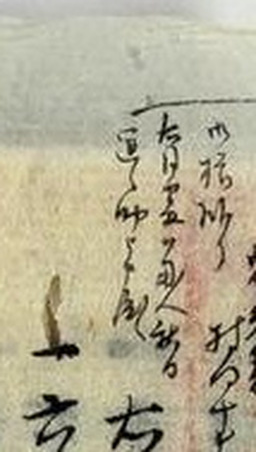運之助被申渡候
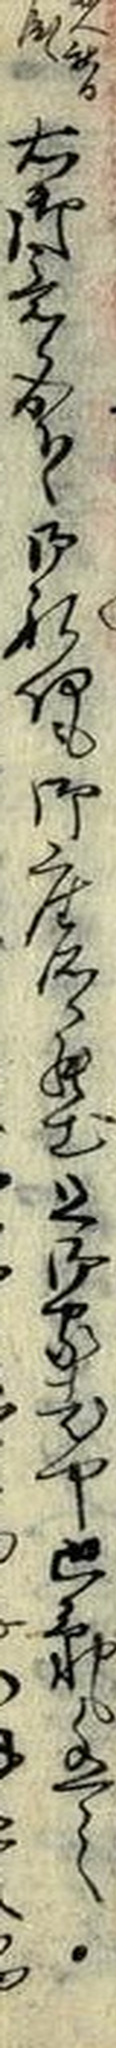右御意被成下候御礼何も御座所へ罷出且御家老中廻勤も有之
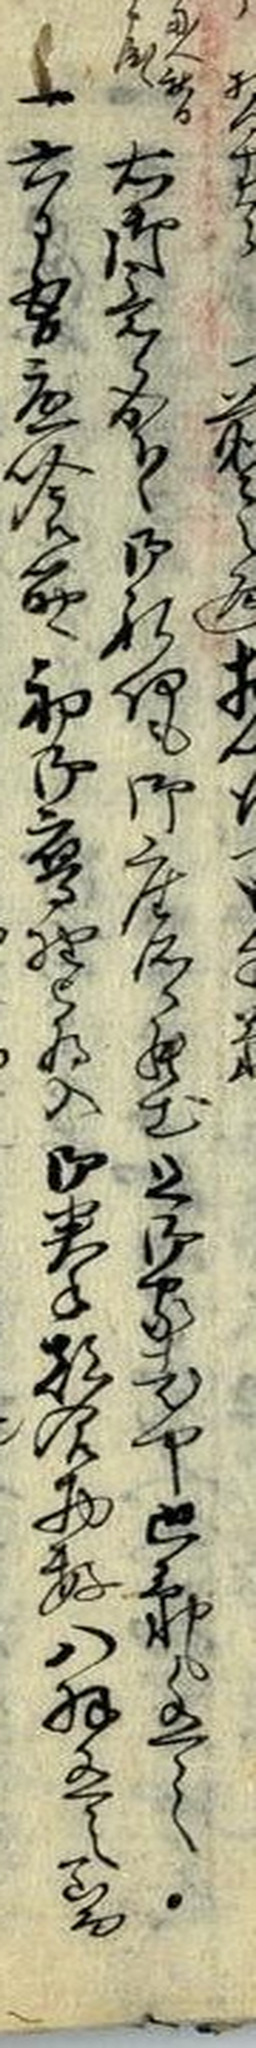一六月五日底喰筋へ初御鷹野被為入御拳都合物数八羽有之到而
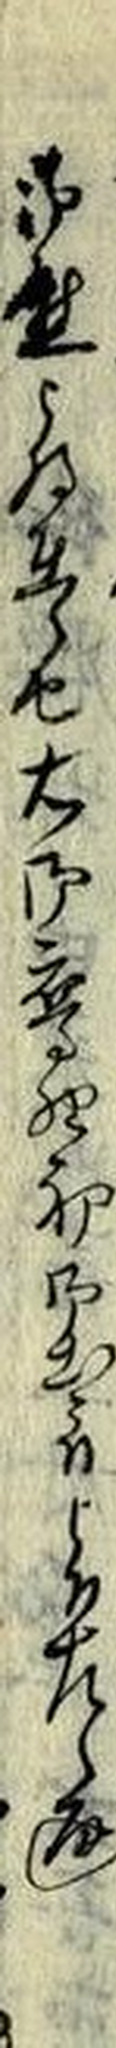御慰被為在候由右御鷹野初御出ニ付被下左之通
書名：少傅日録抄（斉承付側向頭取日記、在国）
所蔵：福井県文書館 Fukui Prefectural Archives
